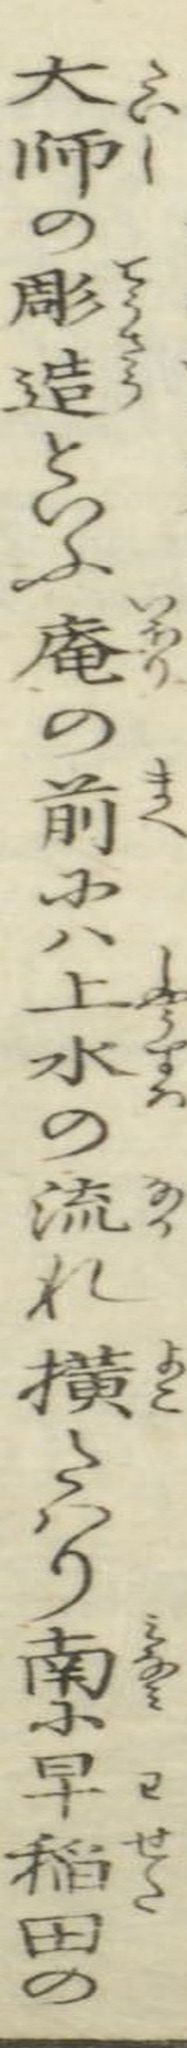大師の彫造といふ庵の前には上水の流れ横たはり南に早稲田の
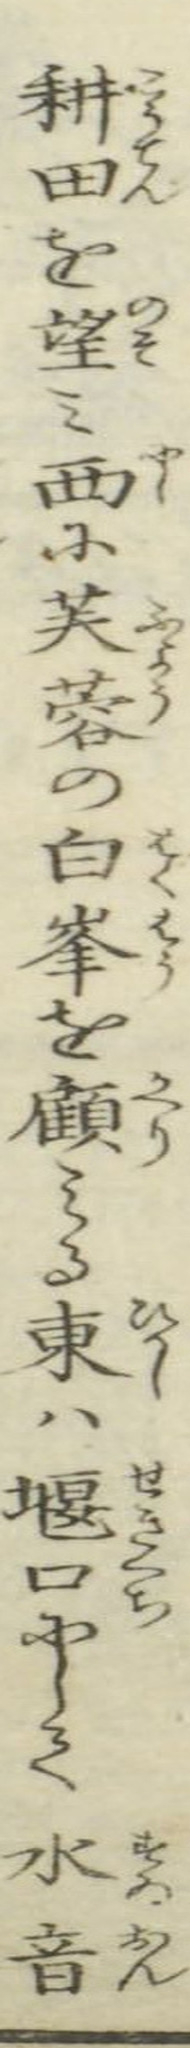耕田を望み西に芙蓉の白峯を顧みる東は堰口にして水音
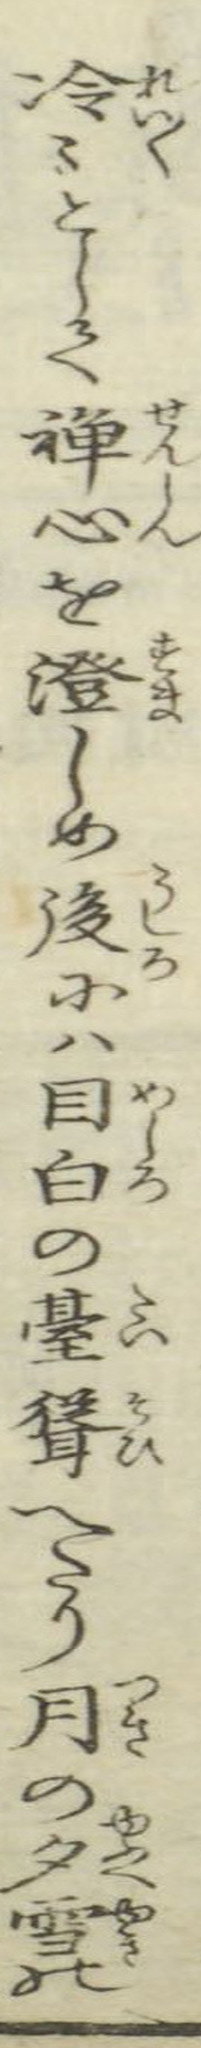冷々として禅心を澄しめ後には目白の臺聳へたり月の夕雪の

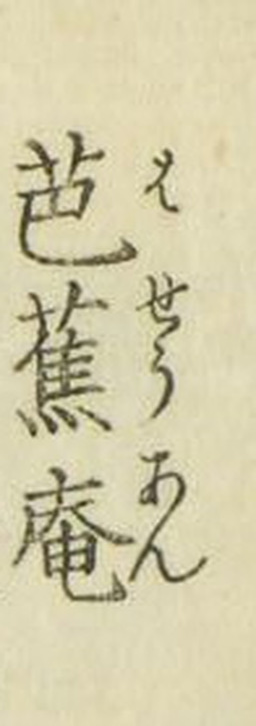芭蕉庵
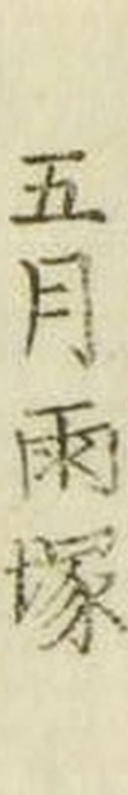五月雨塚
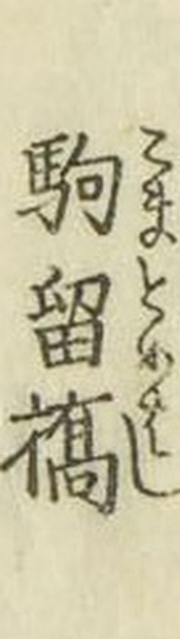駒留橋
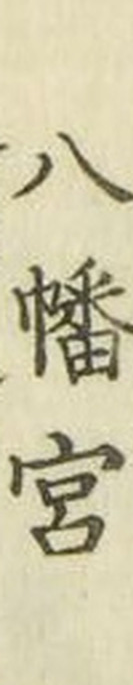八幡宮
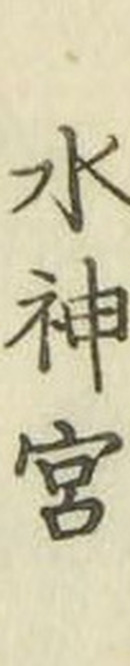水神宮
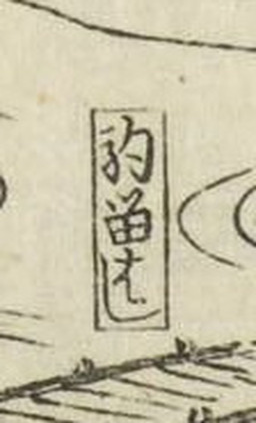駒留はし

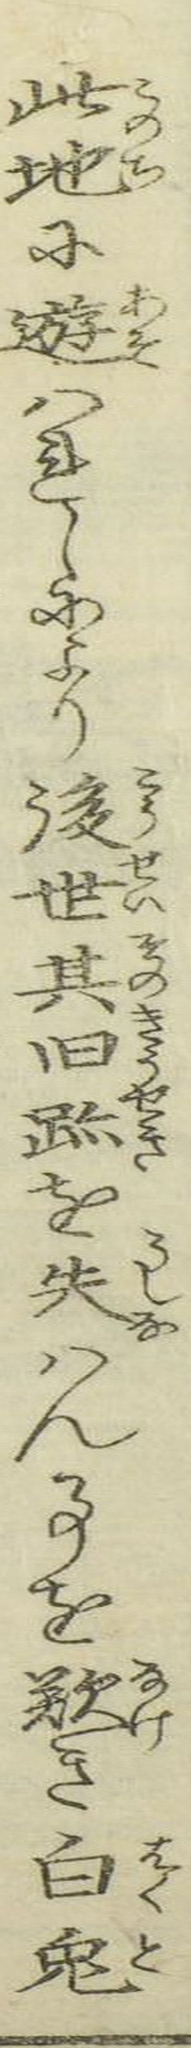此地に遊はれしにより後世其旧跡を失はん事を歎き白兎
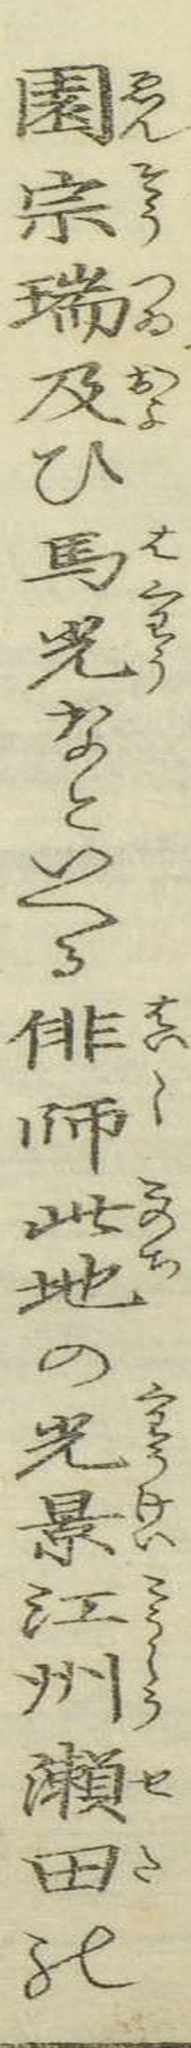園宗瑞及ひ馬光なといへる俳師此地の光景江州瀬田の
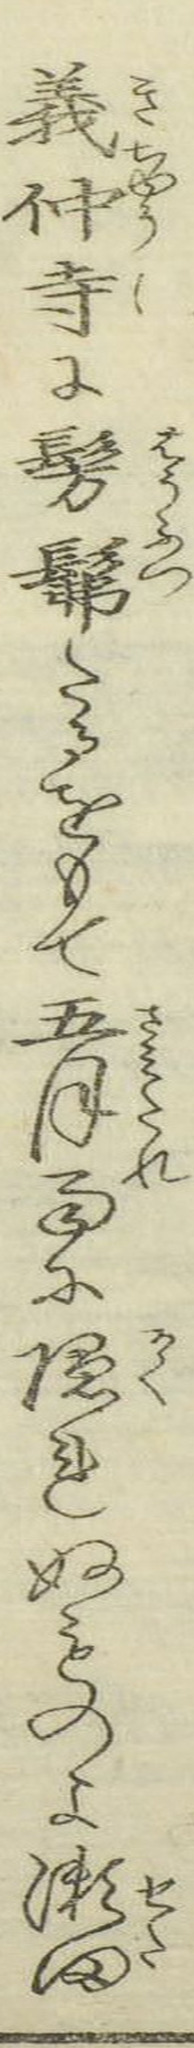義仲寺に髣髴たるをもて五月雨に隠れぬものよ瀬田
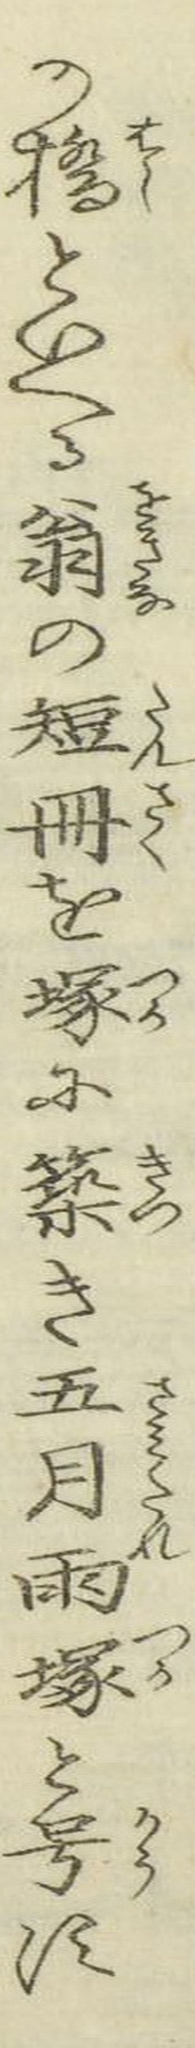の橋といへる翁の短冊を塚に築き五月雨塚と号す
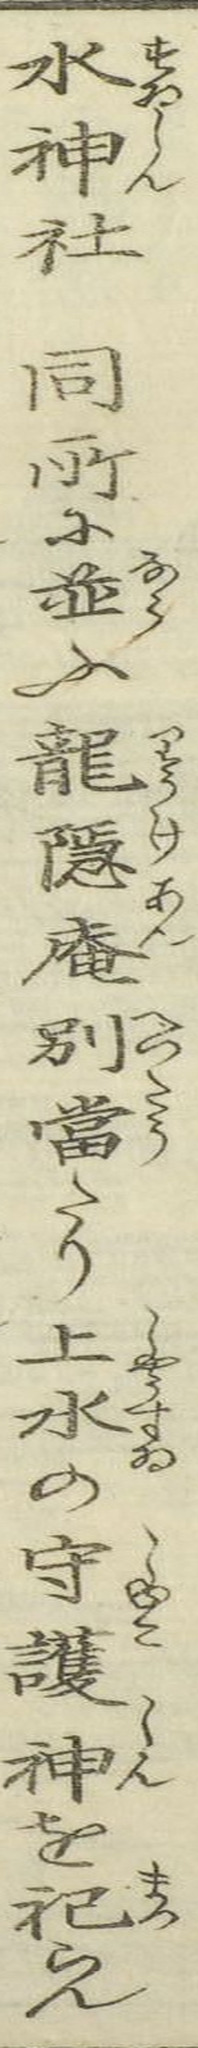水神社同所に並ふ龍隠庵別當たり上水の守護神を祀らん
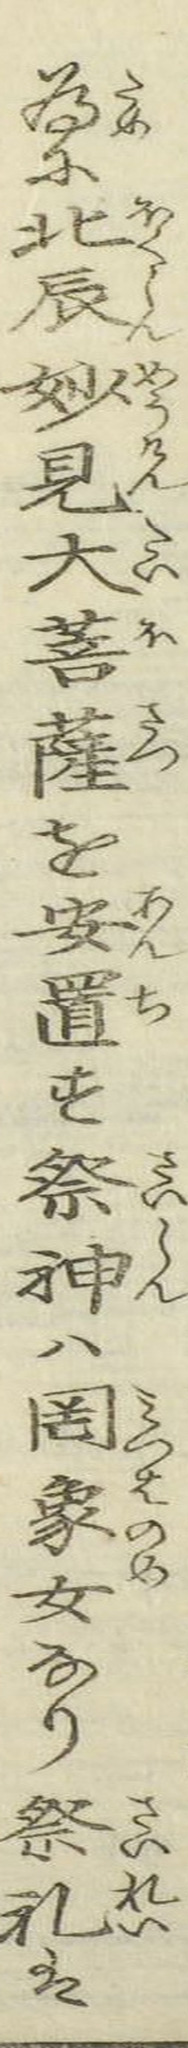為に北辰妙見大菩薩を安置す祭神は罔象女なり祭礼は
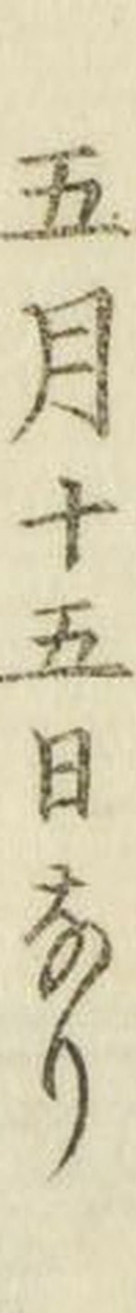五月十五日なり
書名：江戸名所図会 20巻 巻之12
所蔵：東京学芸大学教育コンテンツアーカイブ
